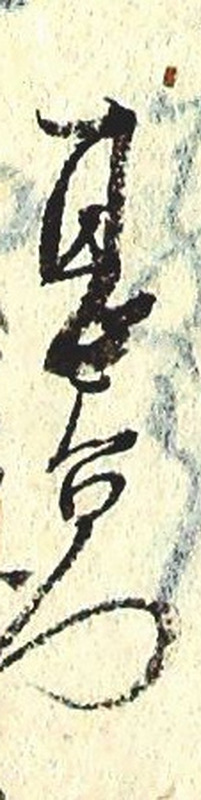源右衛門
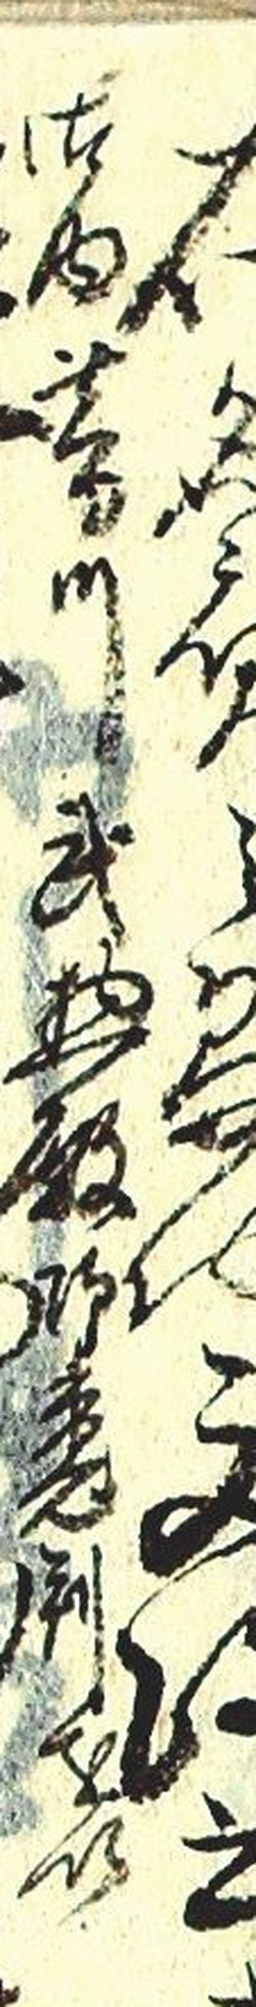御内芳川武惣殿御裏判を以
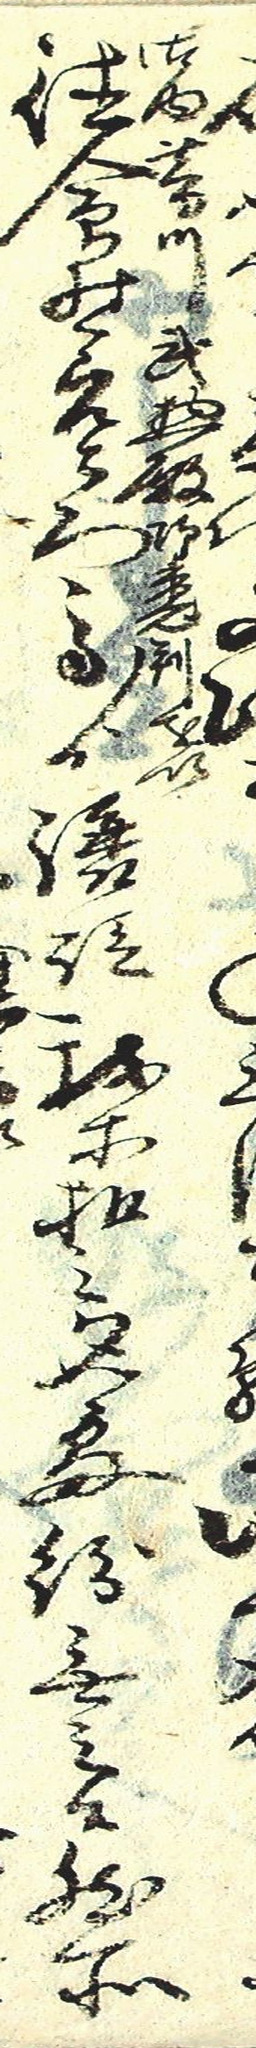徳命村善右衛門方ゟ譲受我等扣之名畠紛無之候然所
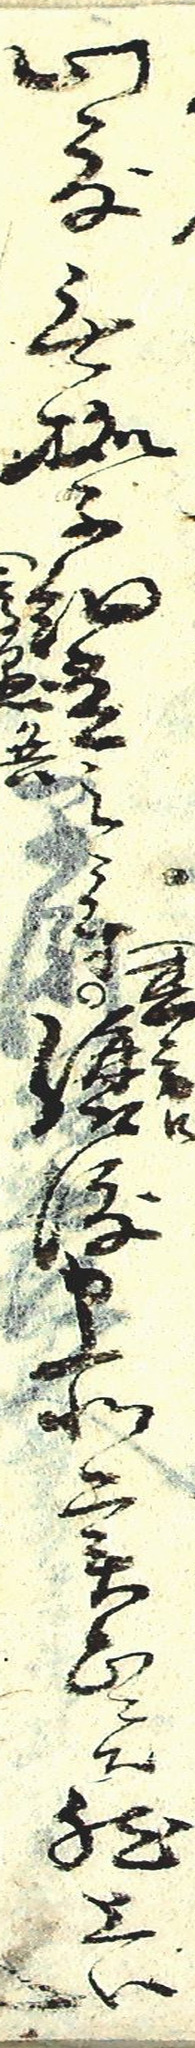此度無拠子細有之に付其方え譲渡申所実正に候然上は
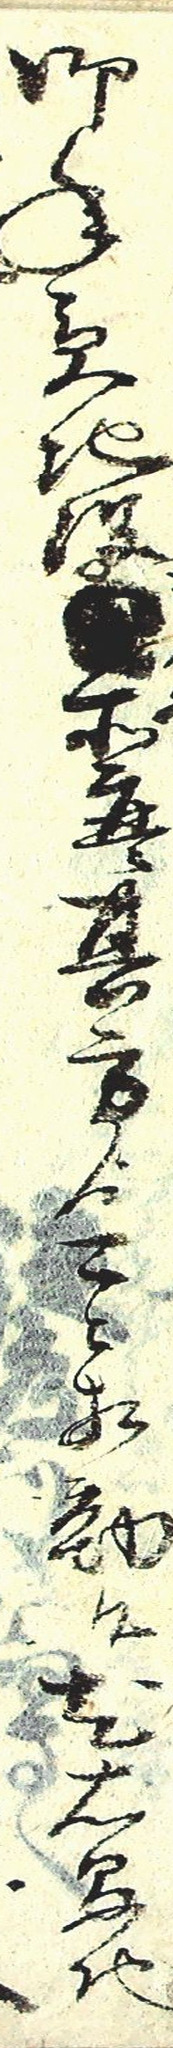御年貢地役高懸り共所並に其方ゟ可被相勤候尤右畠地
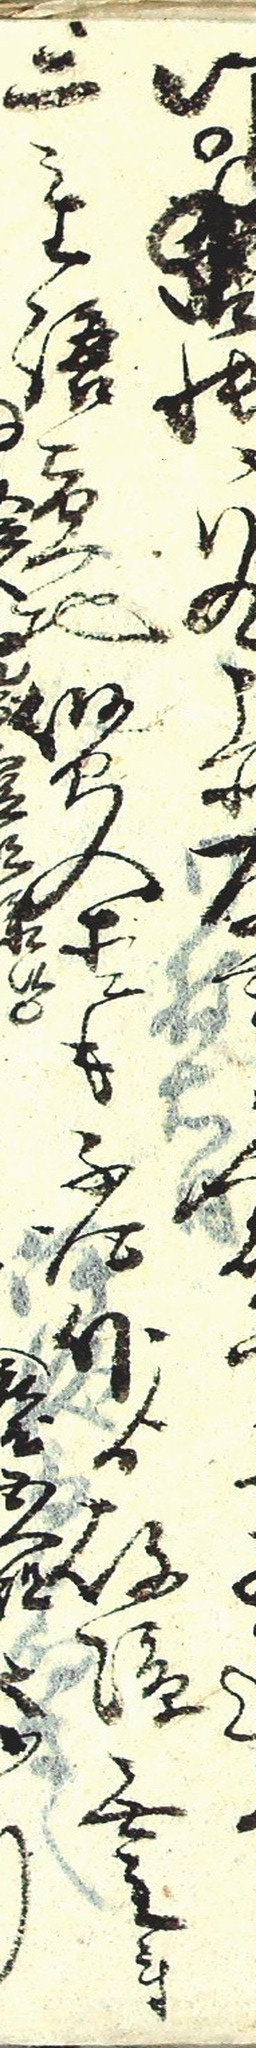二重譲売地質入等にも不仕外ゟ故障無之に付

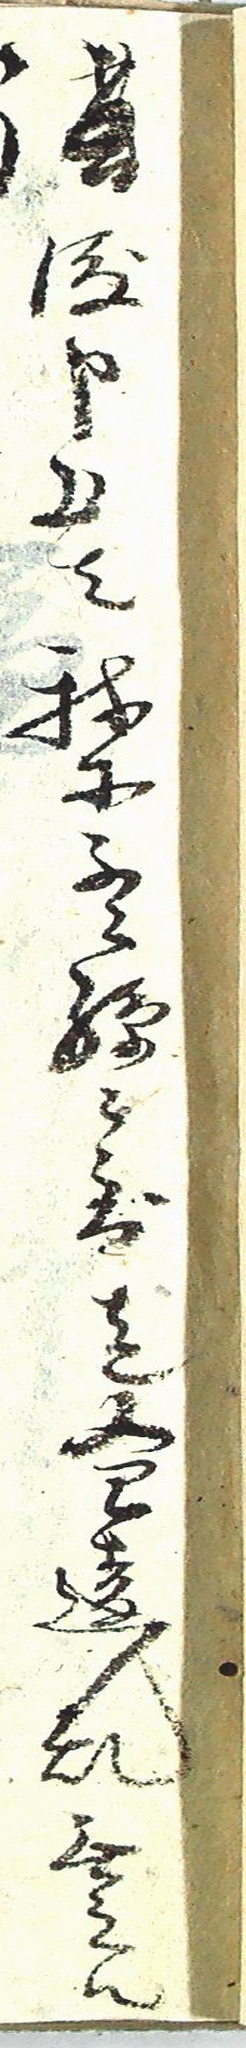譲渡申上は我等子々孫々至迄全違乱無之候
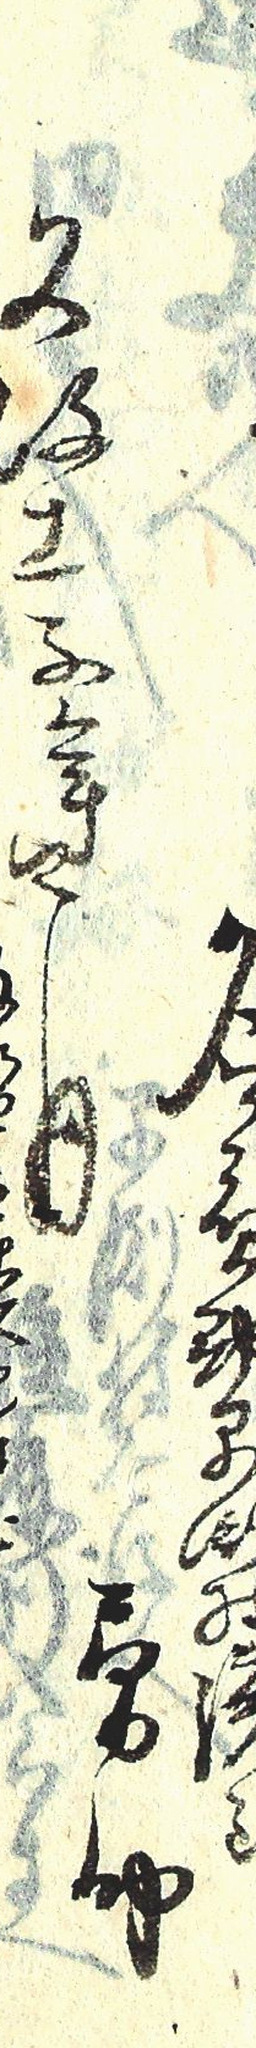文政十一子年四月勇助
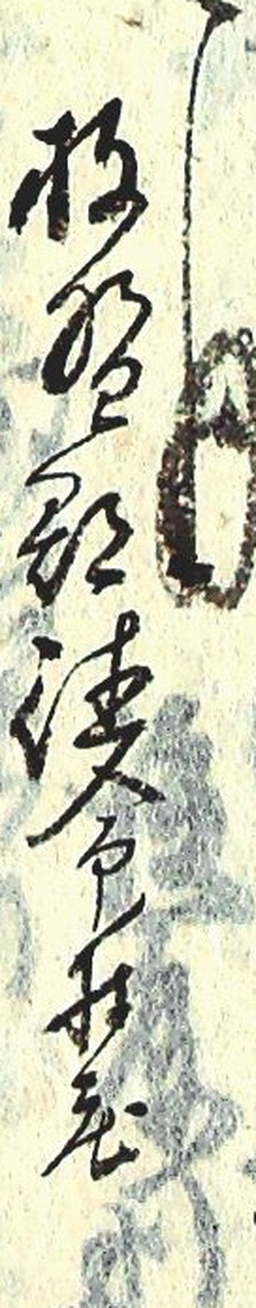板野郡徳命村庄屋
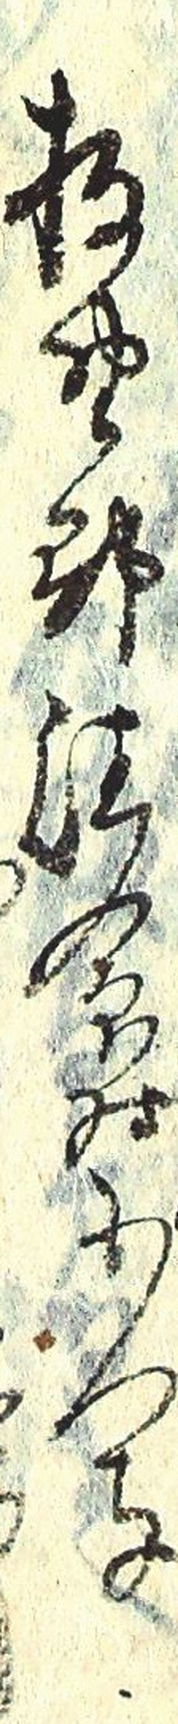板野郡徳命村五人与
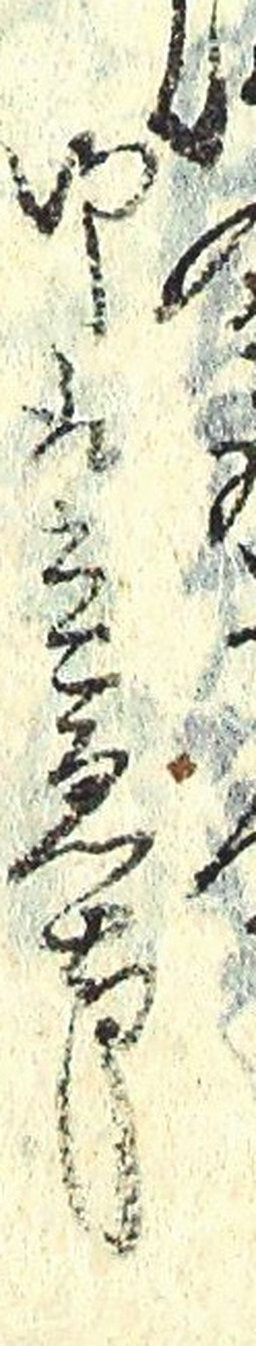御取立兼帯
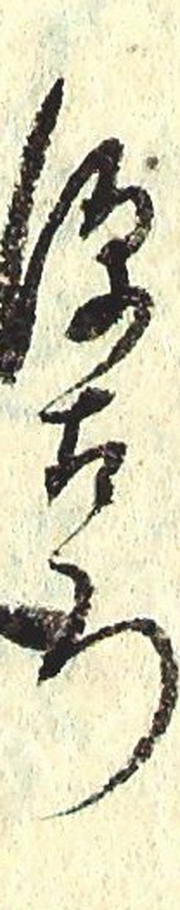源右衛門
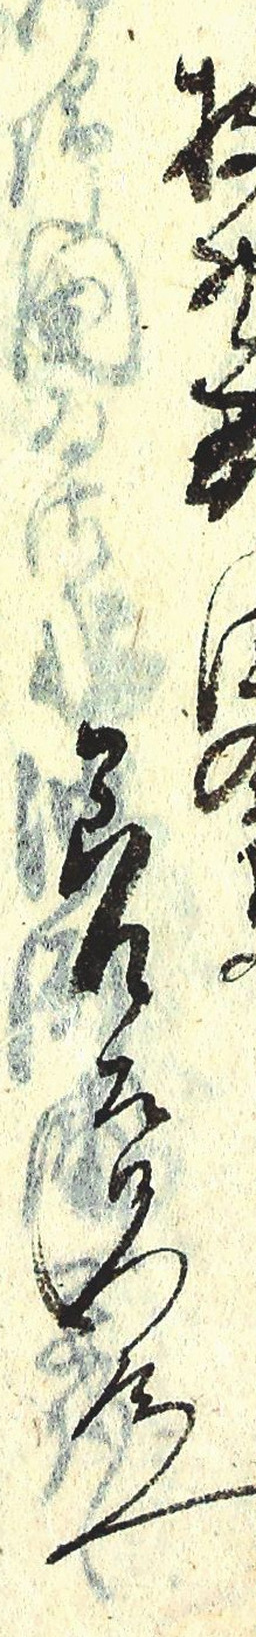善右衛門殿
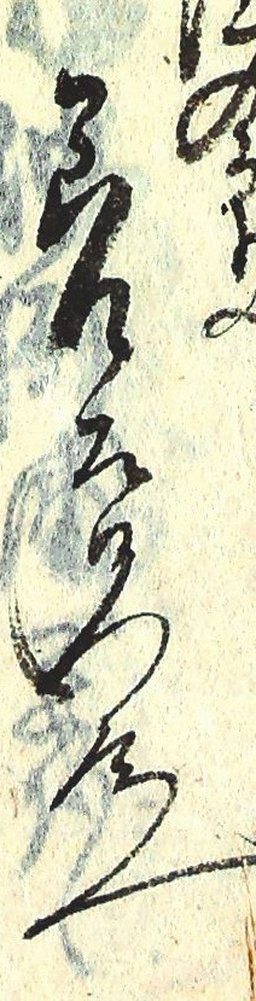善右衛門殿
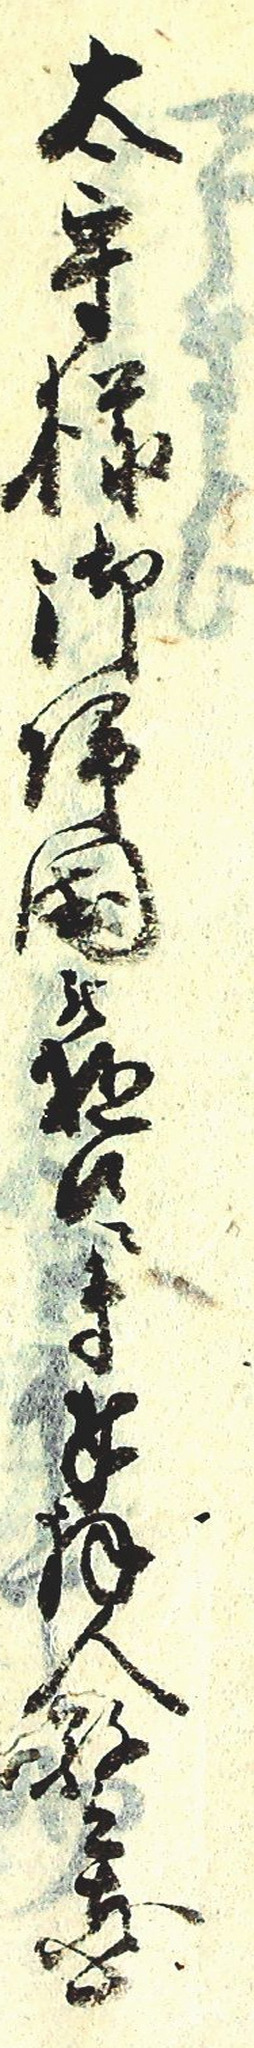太守様御帰国被遊候に付奉拝人警固
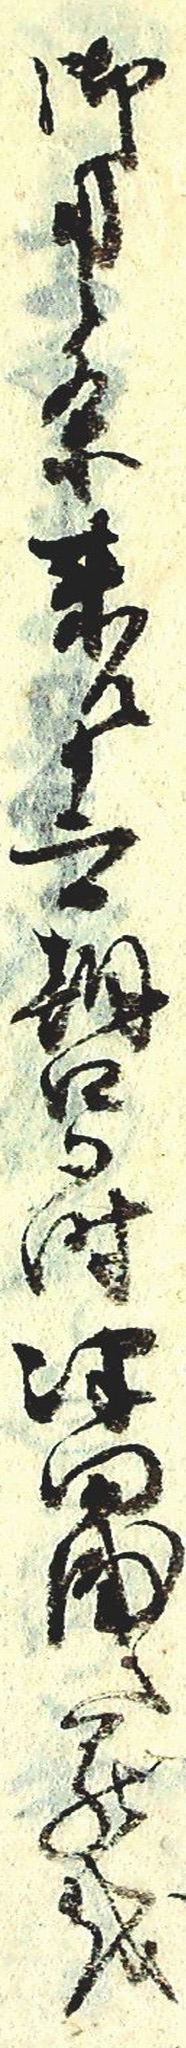御用候条来る十二日朝四つ時津田浦へ罷越
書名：諸御願書控(弐番）
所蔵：鳴門教育大学 Naruto University of Education
